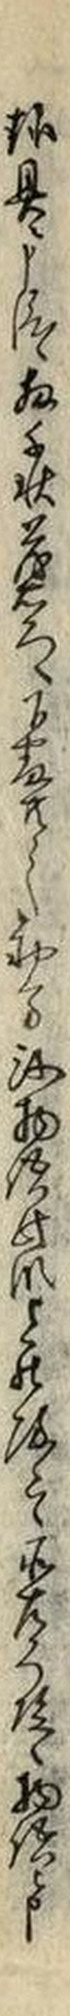趣具に申渡候扨千秋茂右衛門へ下番共之勤方致物語此段被罷越候ハヽ所左衛門殿へ物語被申
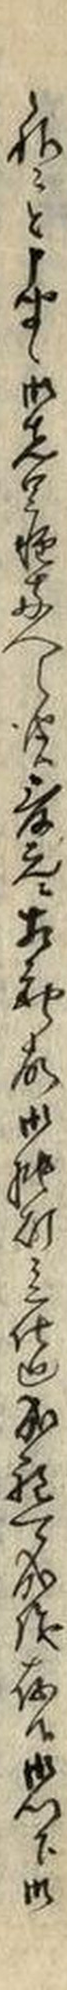候様にと申聞候御先足軽両人之儀爰元に相勤候故御挑灯立仕廻成程可成儀存候御門下御
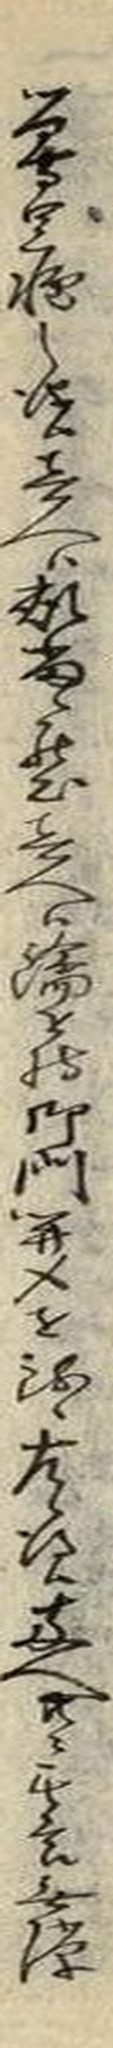留守足軽之儀は壱人は頬当へ罷出壱人は鑰を持御門開〆を致候左候得は両人共に其節無障
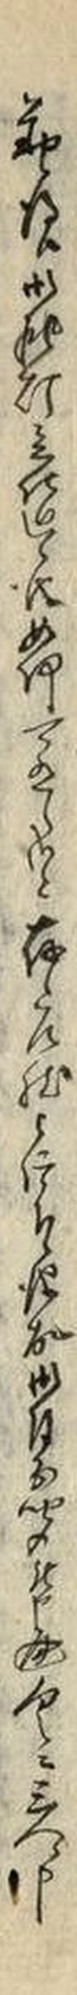勤候得は御挑灯立仕廻候儀如何可有之哉と存候乍然被仰下候儀故御自分聞被申通具に三人へ申
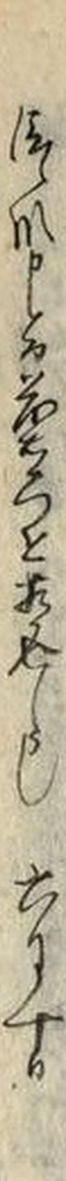渡候段申候間茂右衛門を相返し申候六月十日
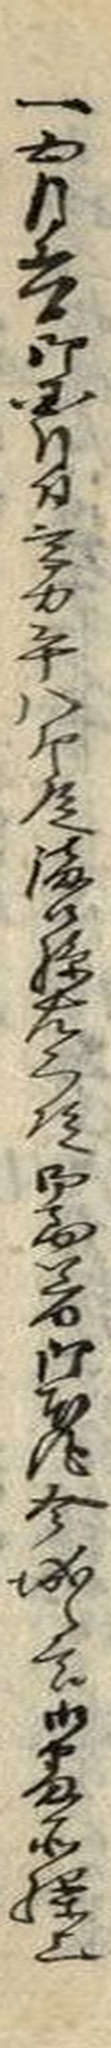一五月六日御国目付高力平八郎殿溝口孫左衛門殿御到着御本丸登城之節御番所繰上
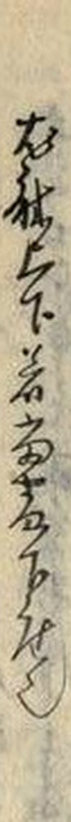尤麻上下着当番下座也
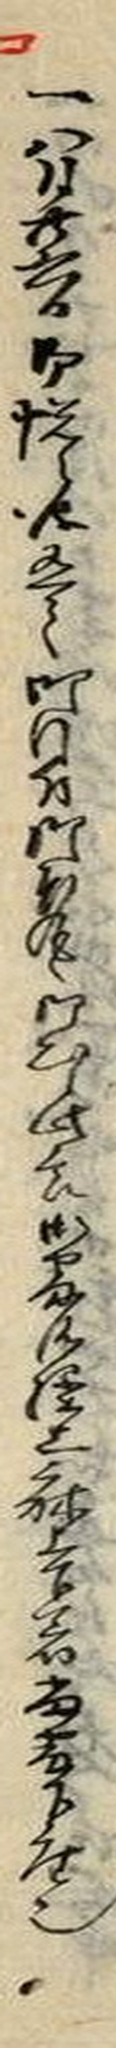一八月廿六日御悦之儀有之御目付御本丸へ御出此節御番所繰上麻上下着当番下座也

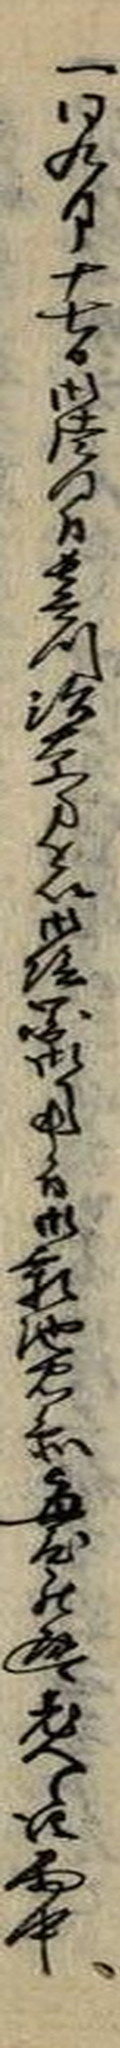一同九月十七日御徒目付長谷川治兵衛方を以御指図御用に付御新池忠兵衛毎度罷通候老人之儀雨中
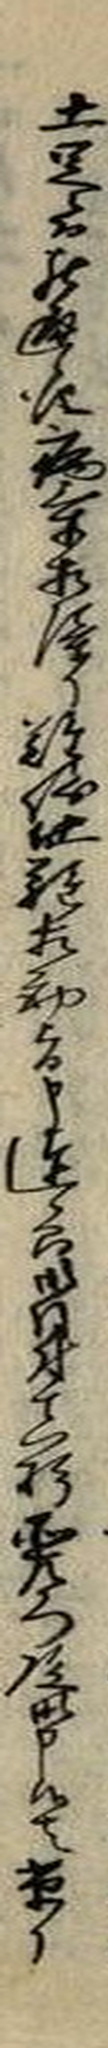土足に而罷通候儀病気相障り難儀仕難相勤旨申達候間御目付真杉所左衛門殿御申候者草り
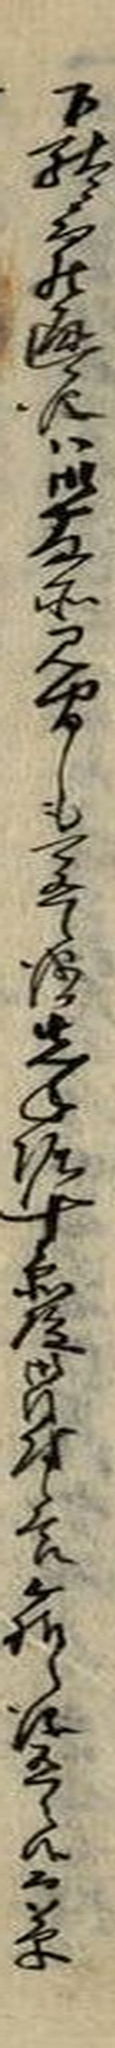下駄に而罷通候儀は御番所見聞も可有之儀候先年堀十兵衛殿御目付之節ヶ様之儀有之候而草
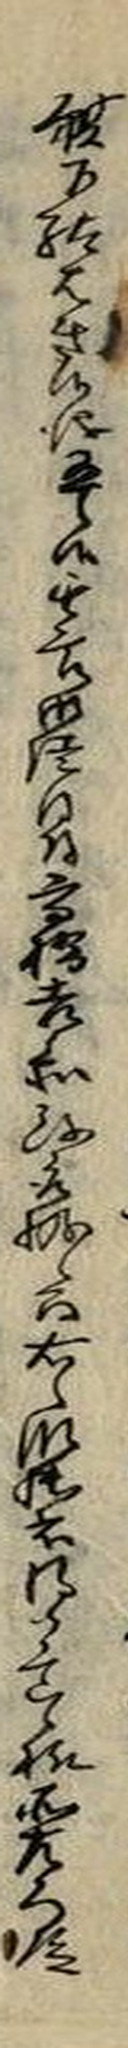履下駄はき候儀有之候其節御徒目付高橋吉兵衛致取扱候間右之段拙者共得御意候様所左衛門殿
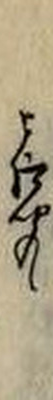被仰聞候
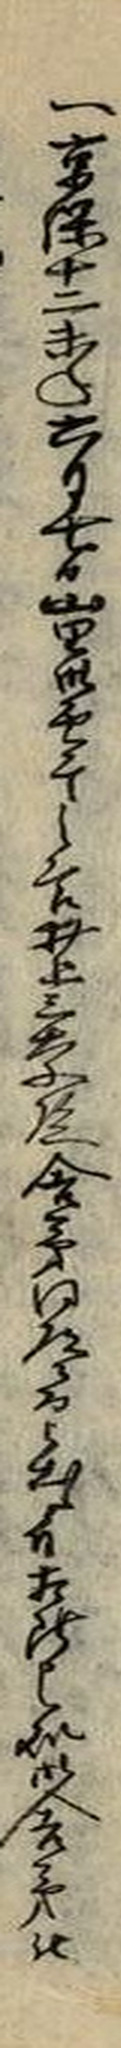一享保十二未年六月七日山里御虫干之節井上三太夫殿舎弟同道に而被出候ニ付相断申候処御舎弟被
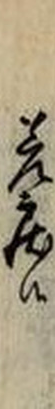差戻候
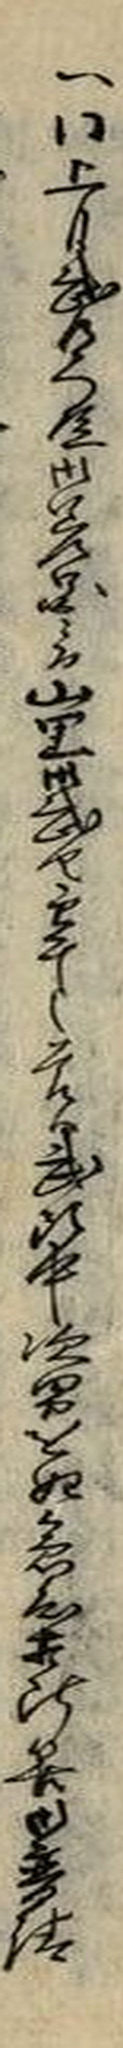一同上月武左衛門殿御差図に而山里御武具虫干之節御武頭中次男を始急度相断筈御普請
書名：御門御櫓之部
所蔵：福井県文書館 Fukui Prefectural Archives
